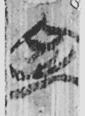室
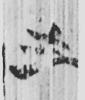之
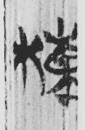棟
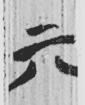亓
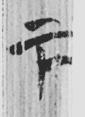下
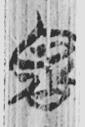{余口}（余）
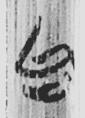句
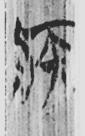疾
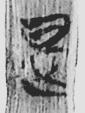是
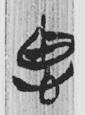思
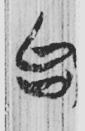句
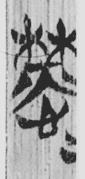{林火心}=
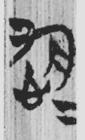恂=
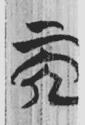而
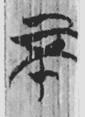不
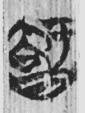智
